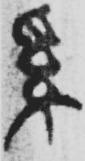奚
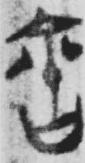舍
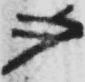之
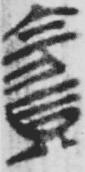賓
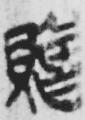贈
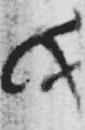氏（是）
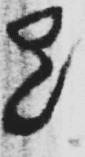也
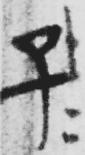孔子
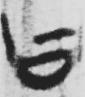曰
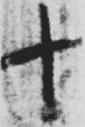七（蟋）
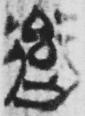率（蟀）
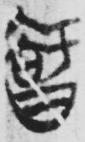智（知）
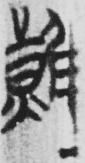難
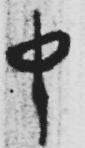中（仲）
